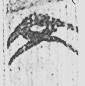文
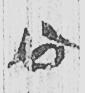公
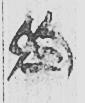於
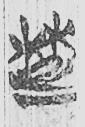楚
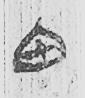囟
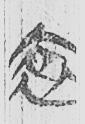{衣衣}
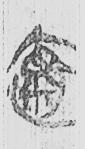褱
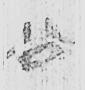公
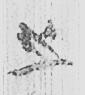之
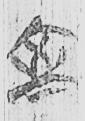室
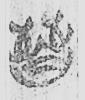晉
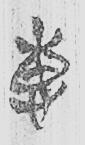惠
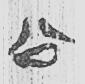公
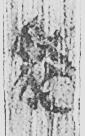卒B
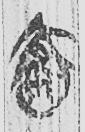褱
